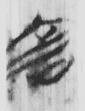害
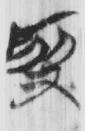{戶刀又}
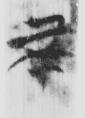不
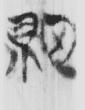則
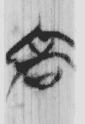高
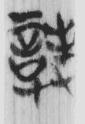{言丰廾}
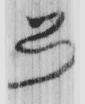乃
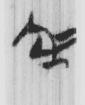身
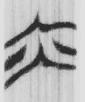亦
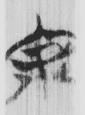余
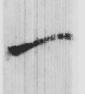一
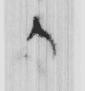人
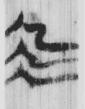永
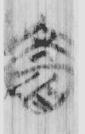{产頁}
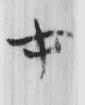才
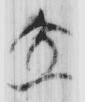立
